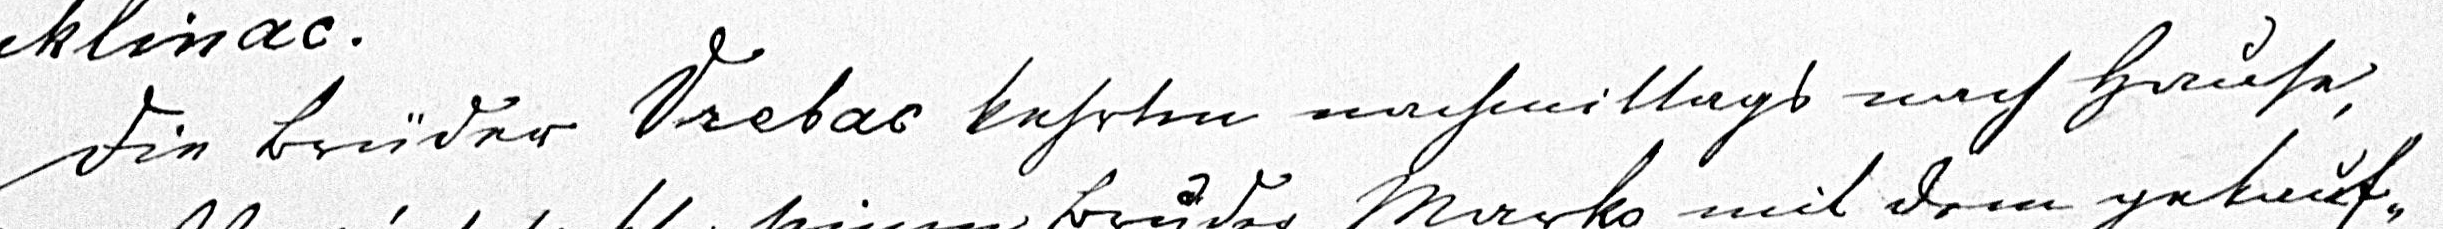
Die Brüder Vrebac kehrten nachmittags nach Hause,
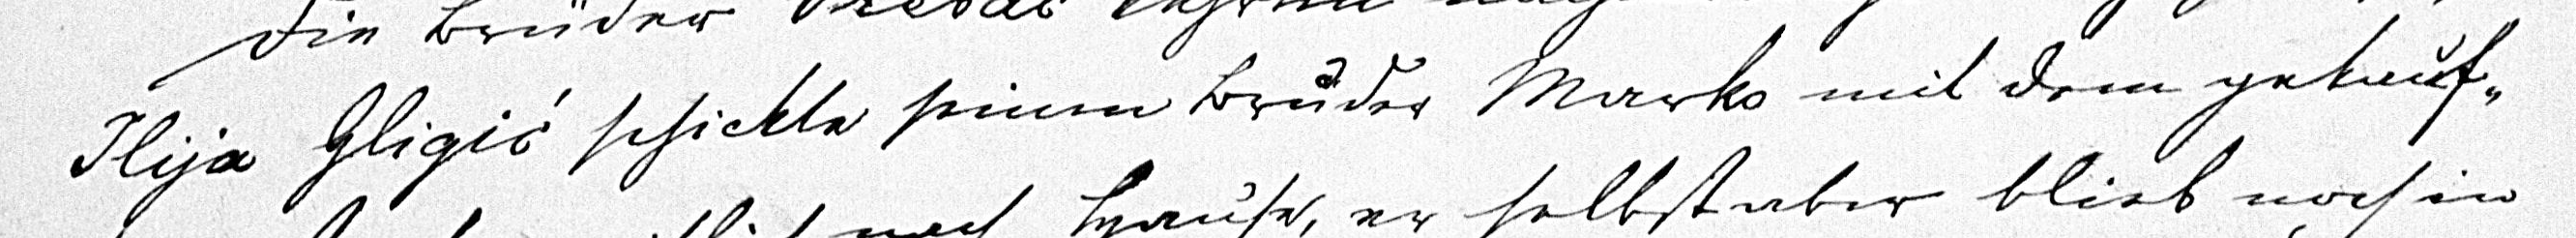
Ilija Gligić schickte seinen Bruder Marko mit dem gekauf¬
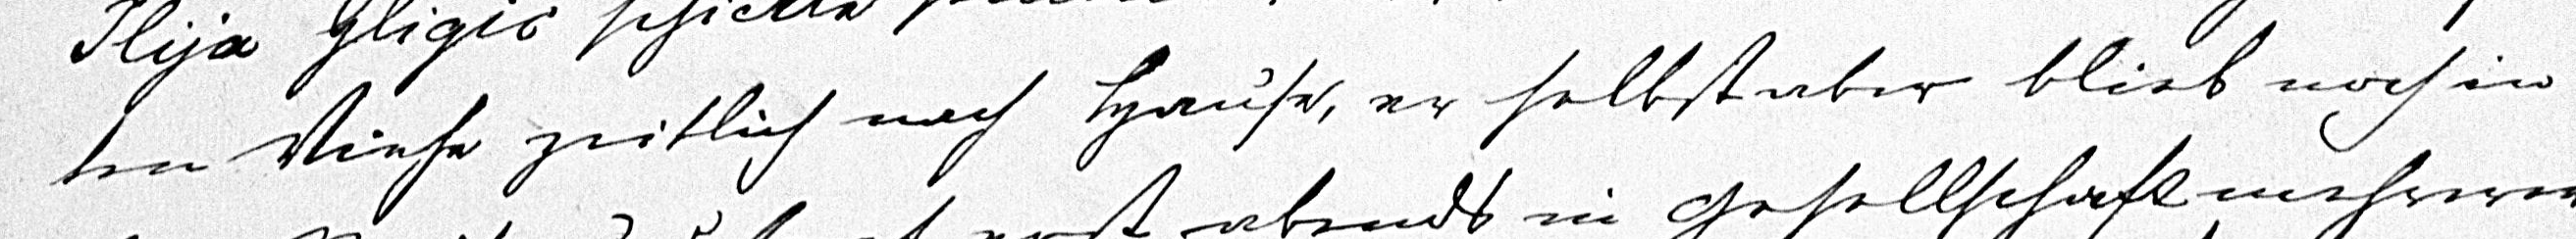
ten Viehe zeitlich nach Hause, er selbst aber blieb noch in
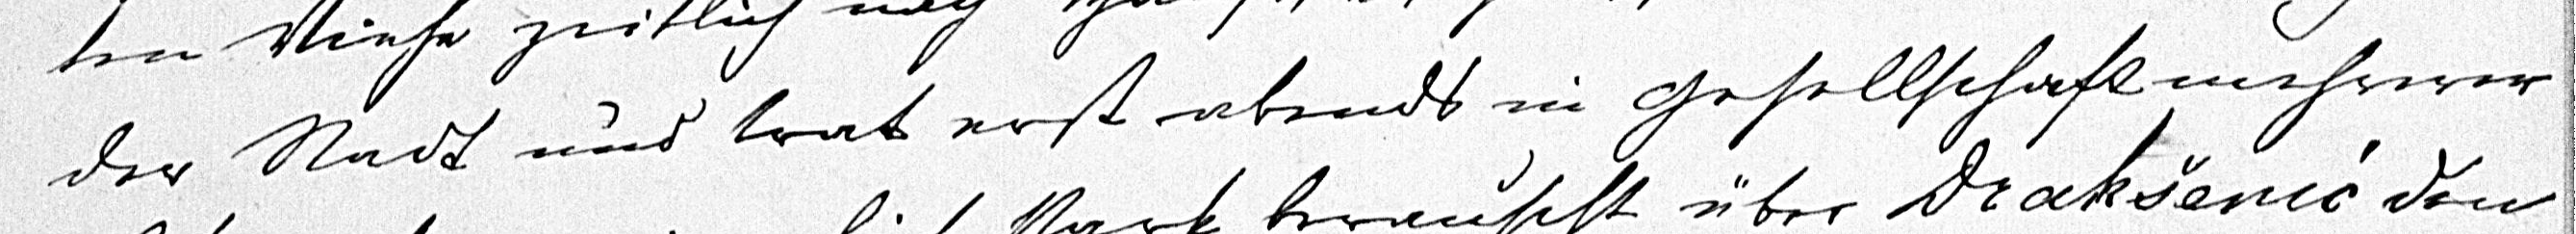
der Stadt und trat erst abends in Gesellschaft mehrerer
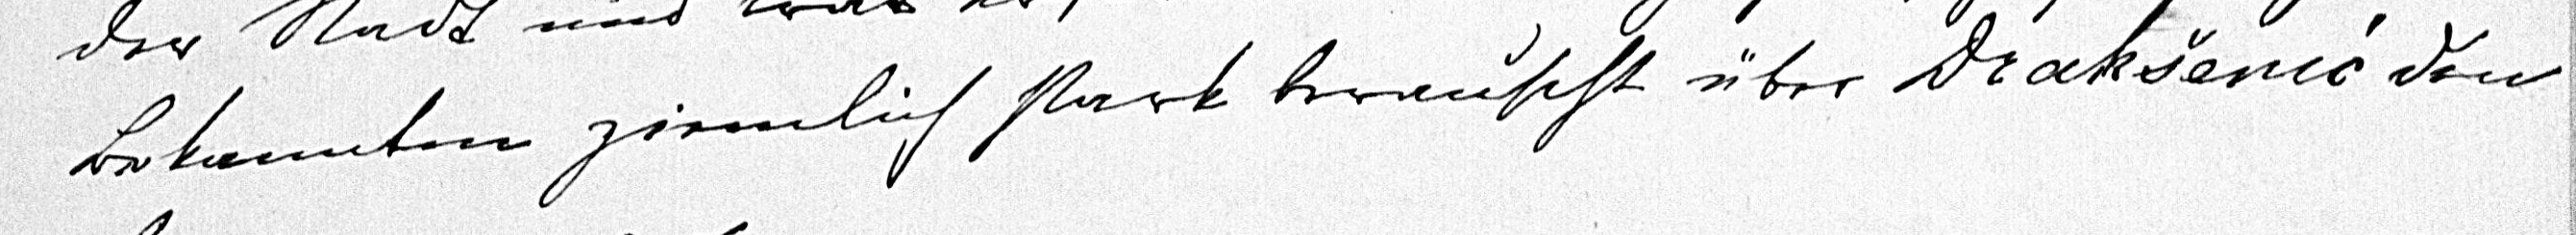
bekannten ziemlich stark berauscht über Drakšenić den
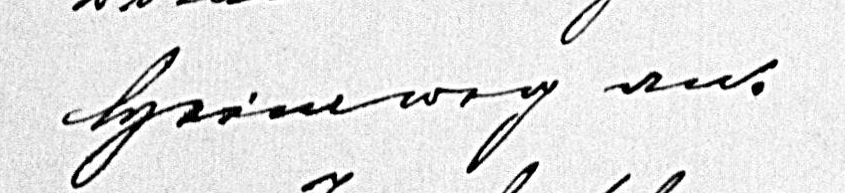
Heimweg an.
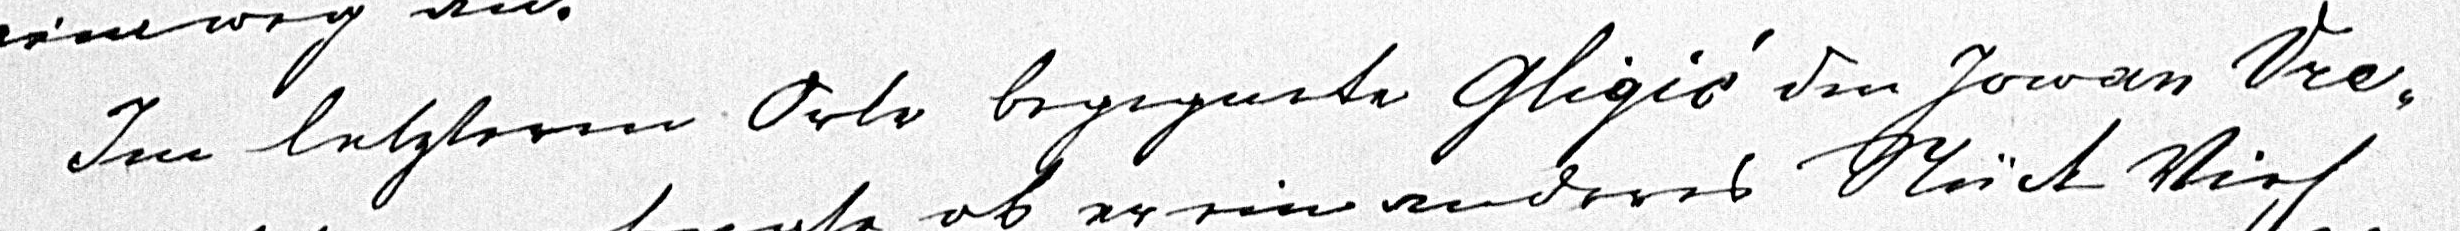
Im letzteren Orte begegnete Gligić den Jowan Vre¬
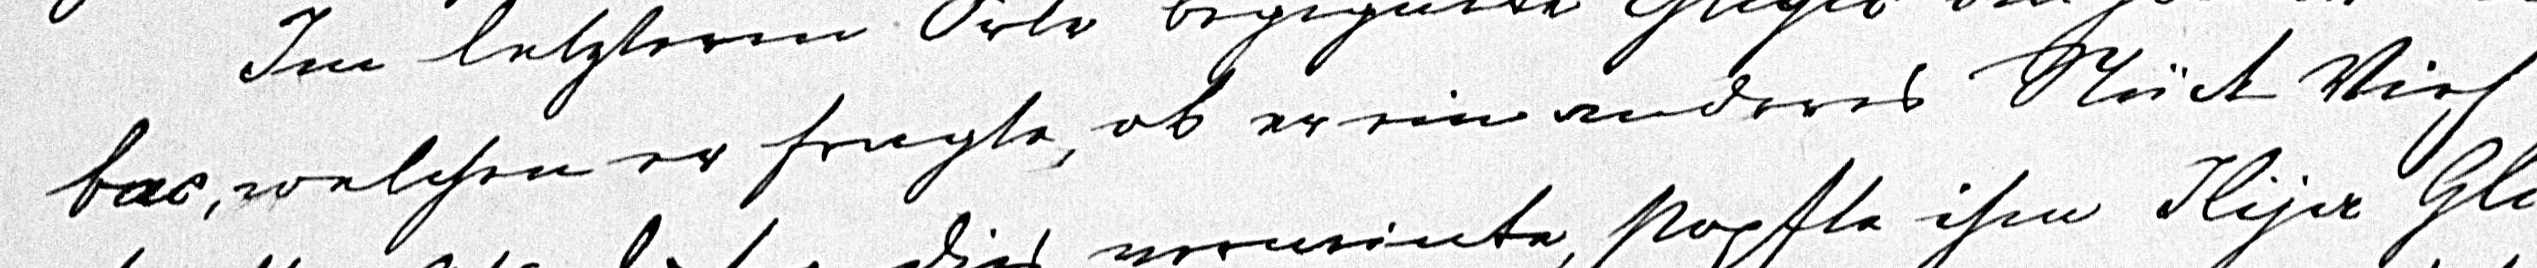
bac, welchen er fragte, ob er ein anderes Stück Vieh¬
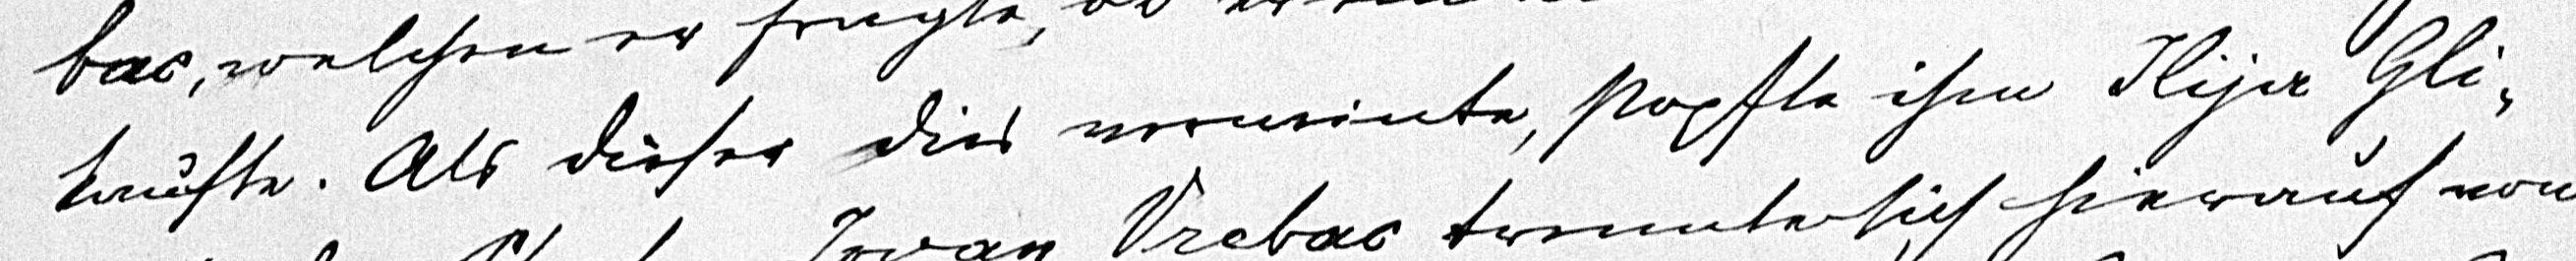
kaufte. Als dieser dies verneinte, stopfte ihm Ilija Gli¬
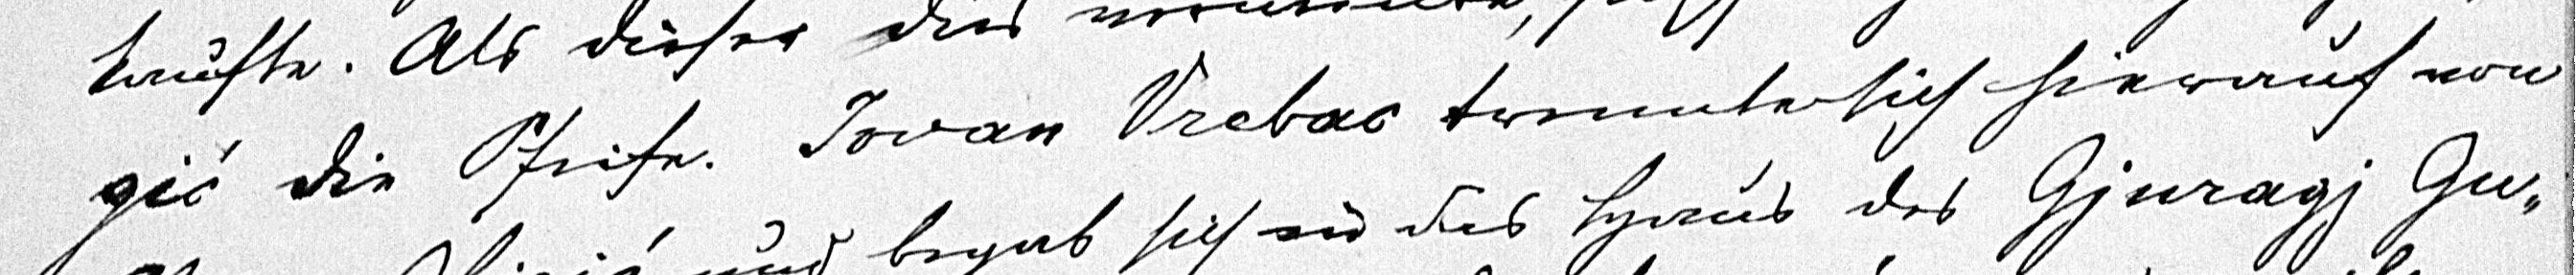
gić die Sfeife. Jovan Vrebac trennte sich hierauf von
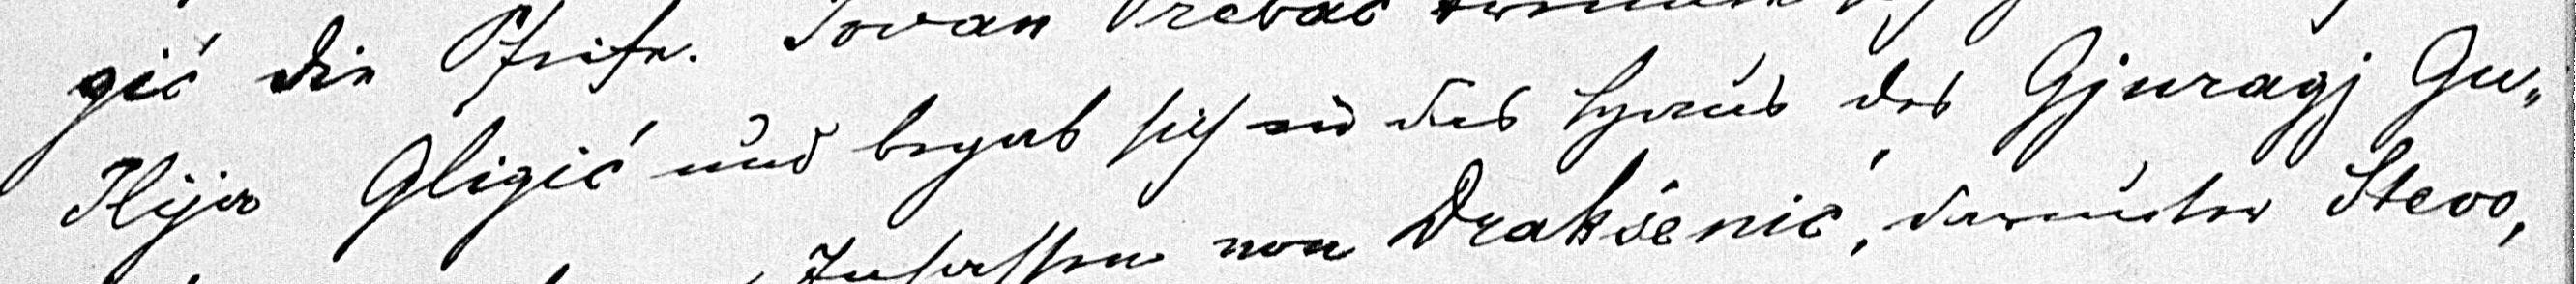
Iljja Gligić aus begab sich xx das Haus des Gjuragj Gu¬
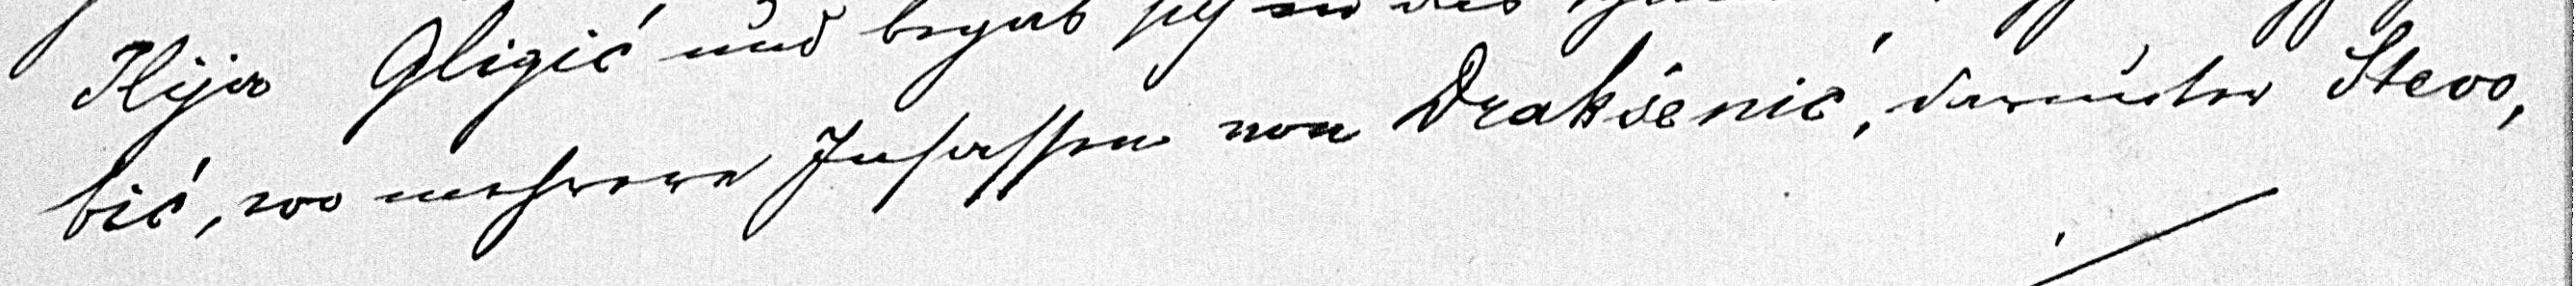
bić, wo mehrere Insassen von Drakšenić, darunter Stevo,
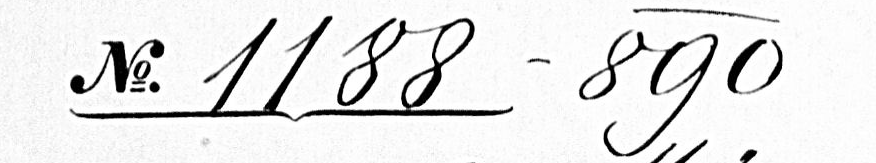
N° 1188 - 890
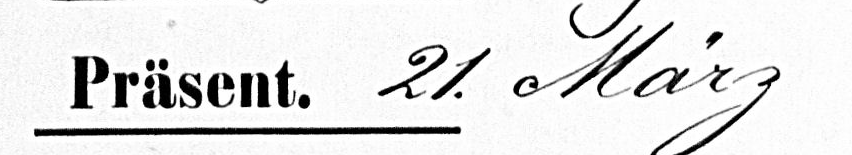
Präsent. 21. März
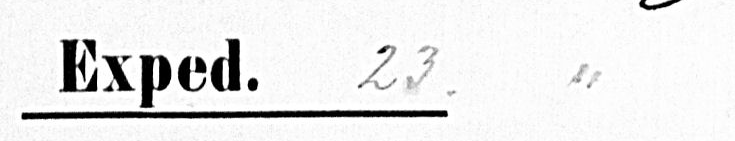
Exped. 23. März
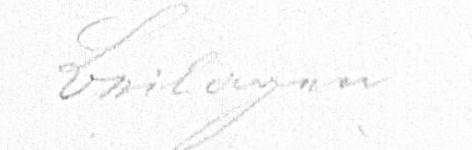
Beilagen
